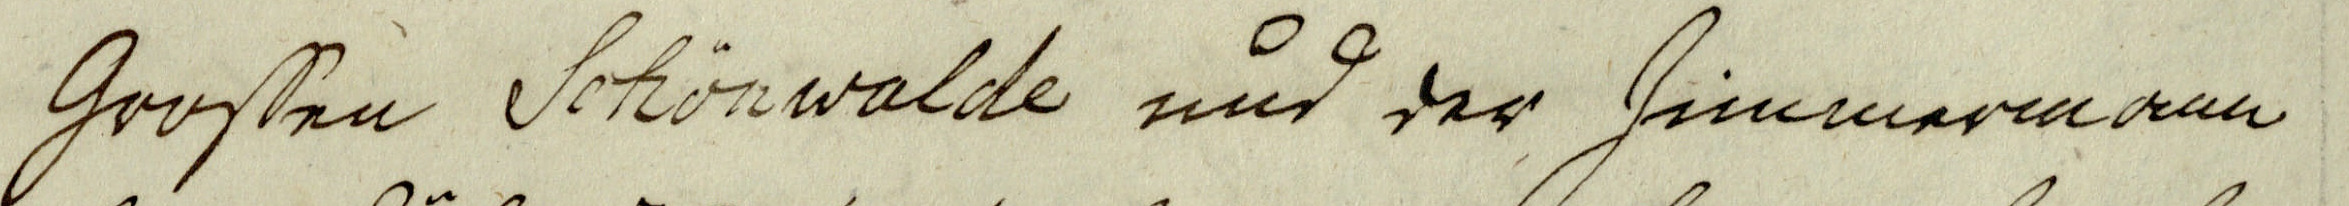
Grossen Schönwalde und der Zimmermann
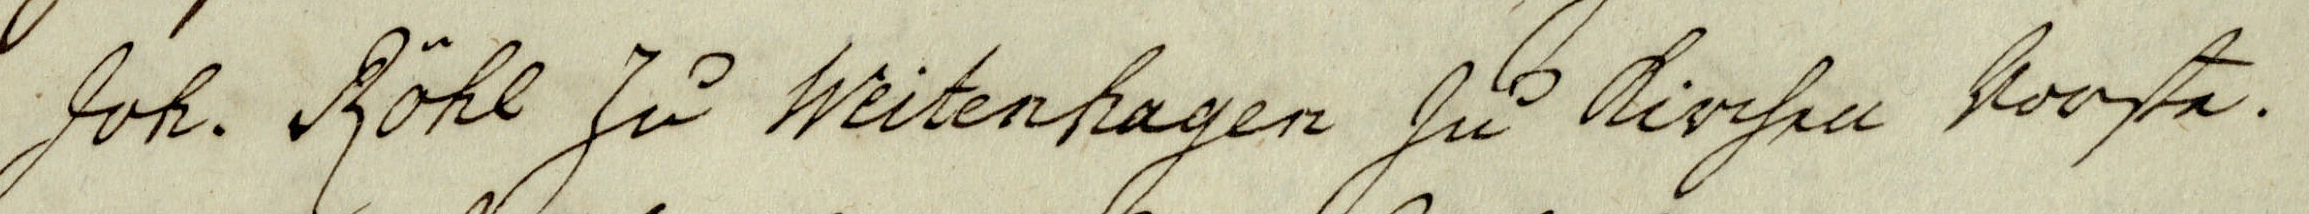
Joh. Köhl zu Weitenhagen zu Kirchen Vorste¬
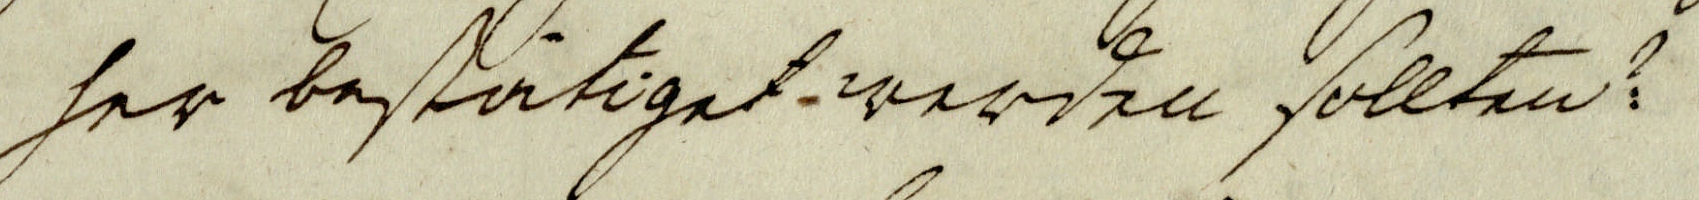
her bestätiget werden sollten?
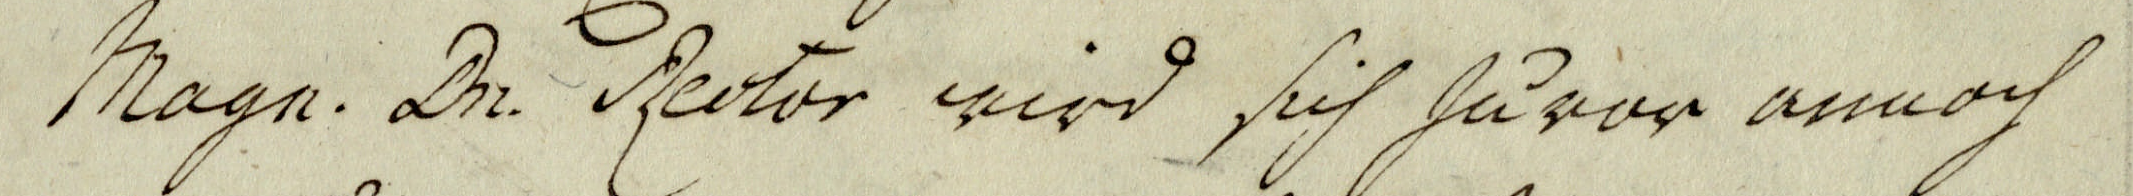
Magn. Dn. Rector wird sich zuvor annoch
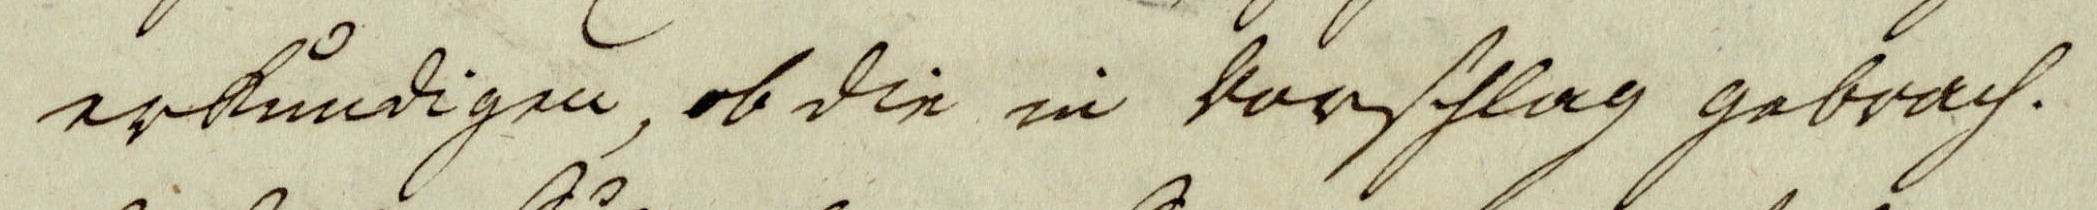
erkundigen, ob die in Vorschlag gebrach¬
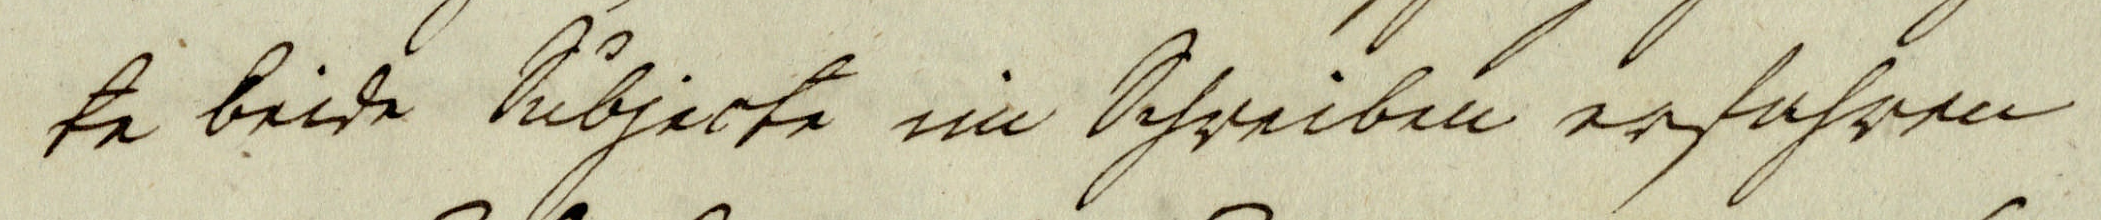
te beide Subjecte im Schreiben erfahren
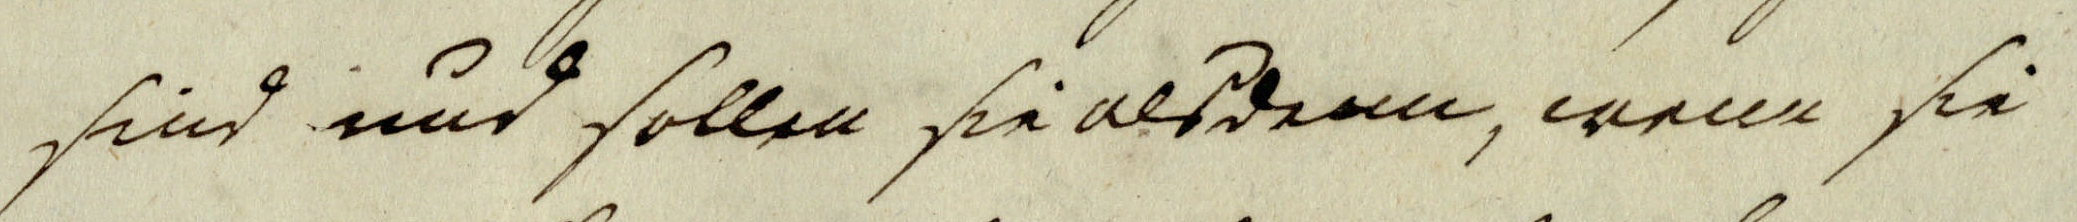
sind und sollen sie alsdann, wenn sie
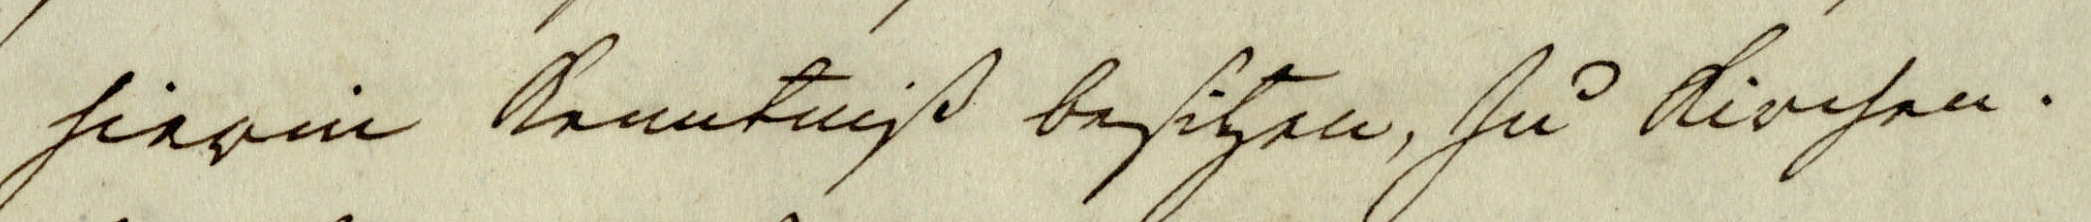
hierin Kenntniß besitzen, zu Kirchen
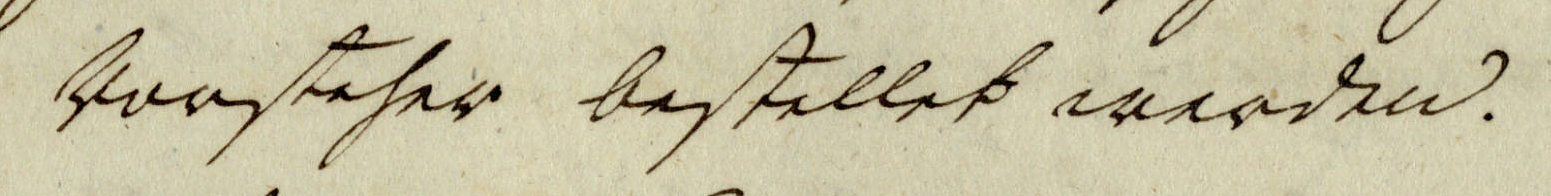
Vorsteher bestellet werden.
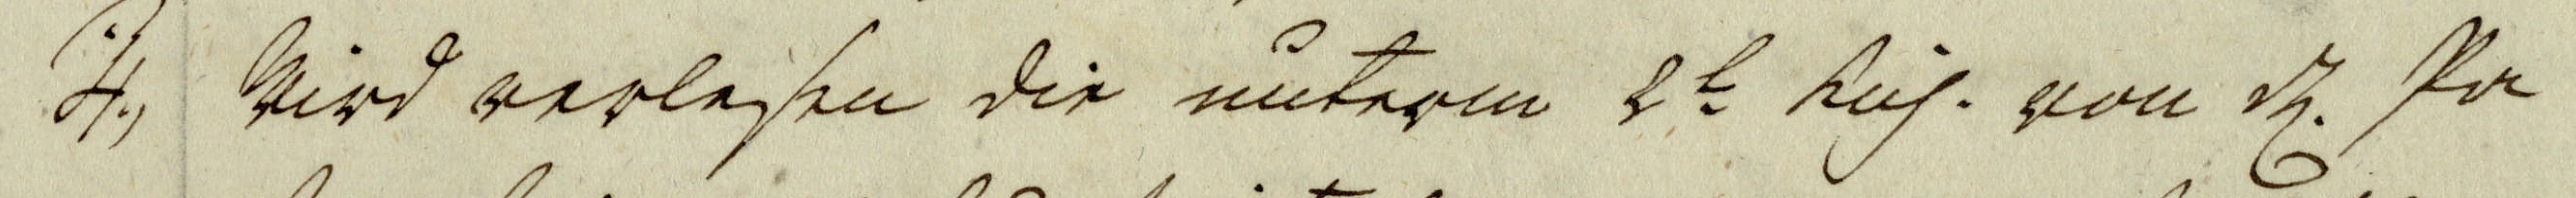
4., Wird verlesen die unterm 2t. huj. von dh. Pa¬
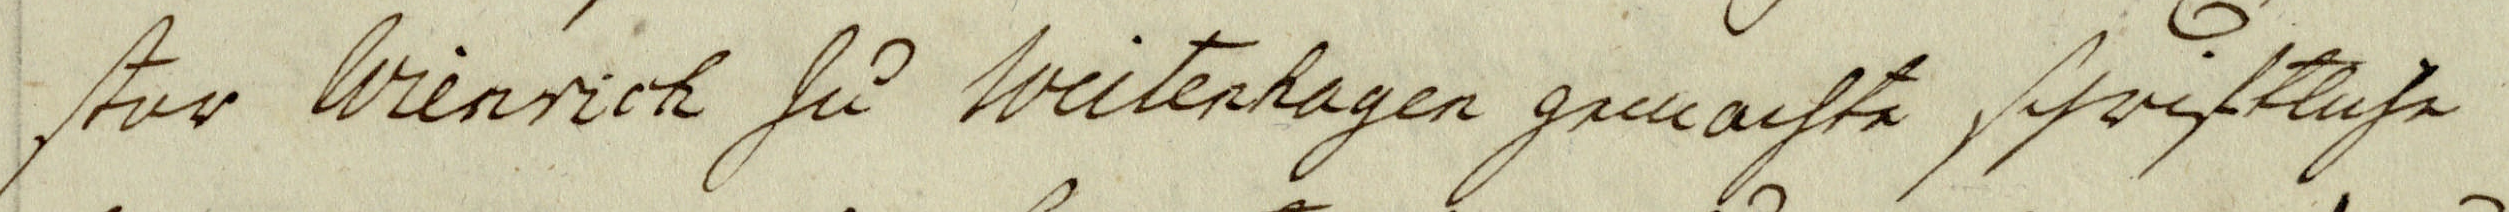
stor Wienrich zu Weitenhagen gemachte schriftliche
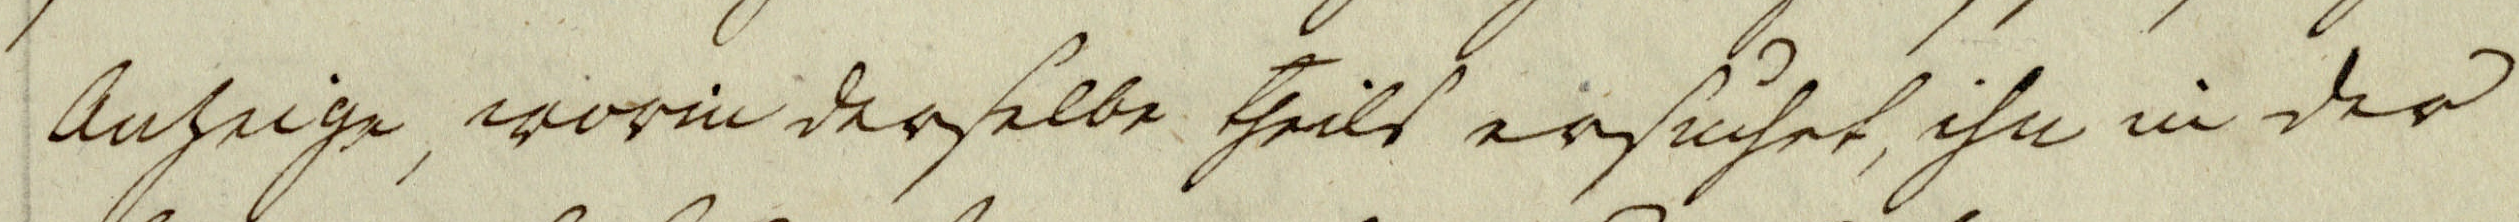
Anzeige, worin derselbe theils ersuchet, ihn in der
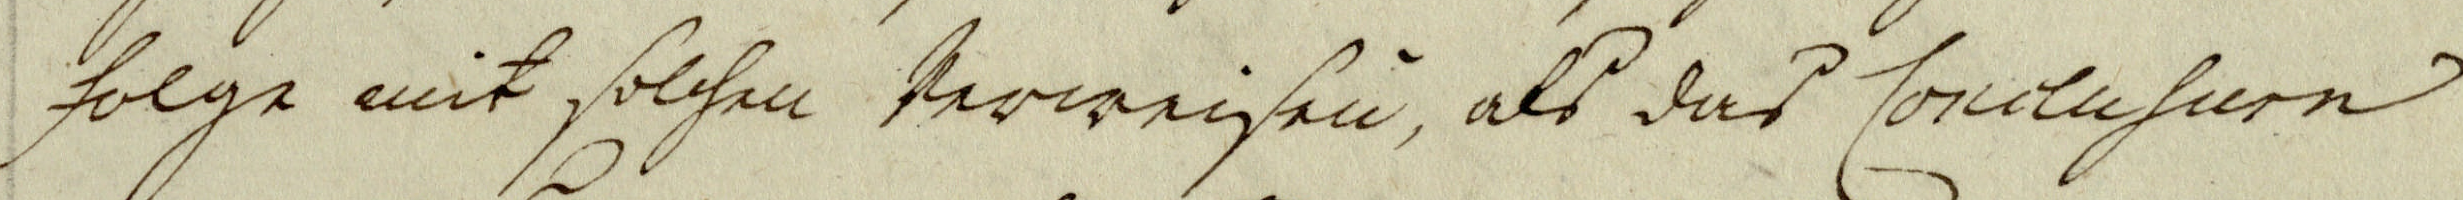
Folge mit solchen Verweisen, als das Conclusum
